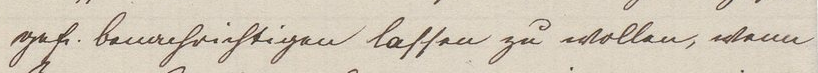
gef. benachrichtigen lassen zu wollen, wenn
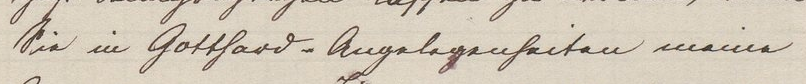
Sie in Gotthard-Angelegenheiten meine
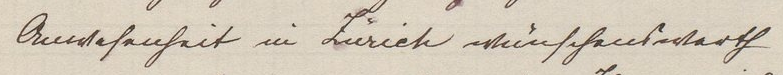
Anwesenheit in Zürich wünschenswerth
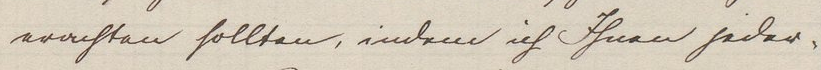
erachten sollten, indem ich Ihnen jeder-
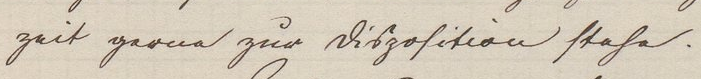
zeit gerne zur Disposition stehe.
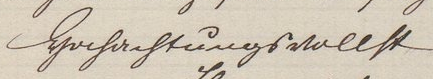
Hochachtungsvollst
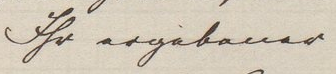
Ihr ergebener
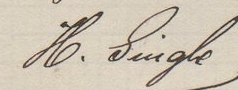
H. Single
